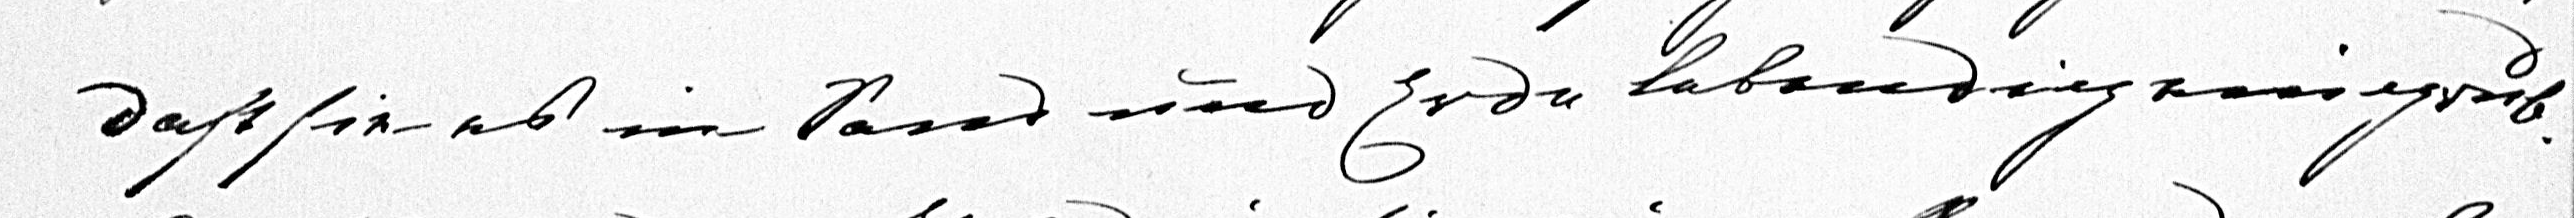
daß sie es in Sand und Erde lebendig eingrub.
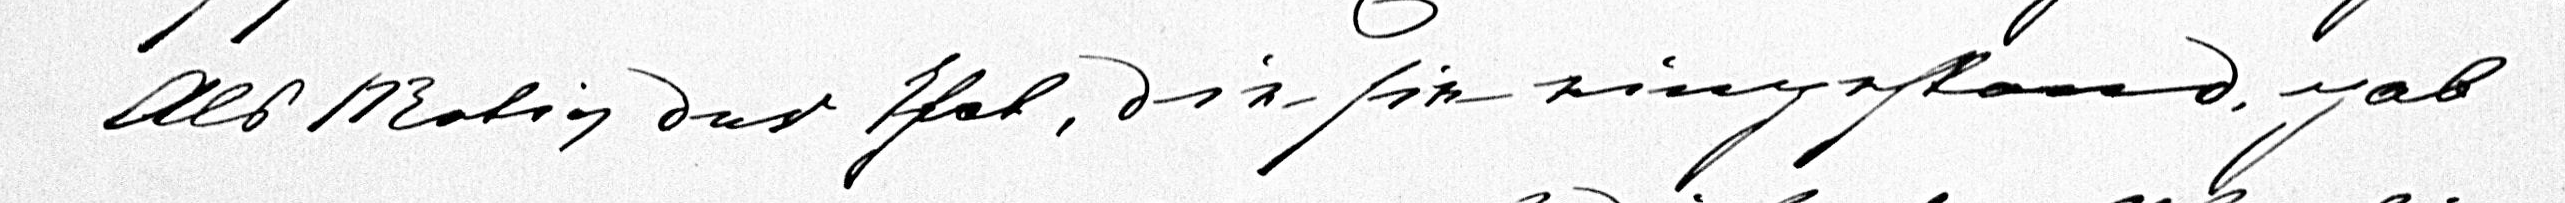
Als Motiv der That, die sie eingestand, gab
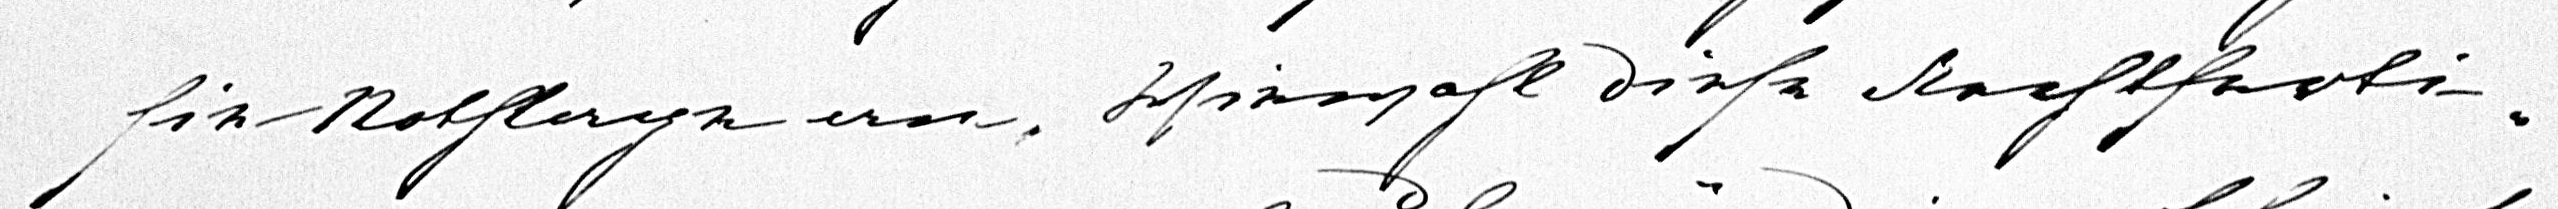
sie Nothlage an. Wiewohl diese Rechtferti¬
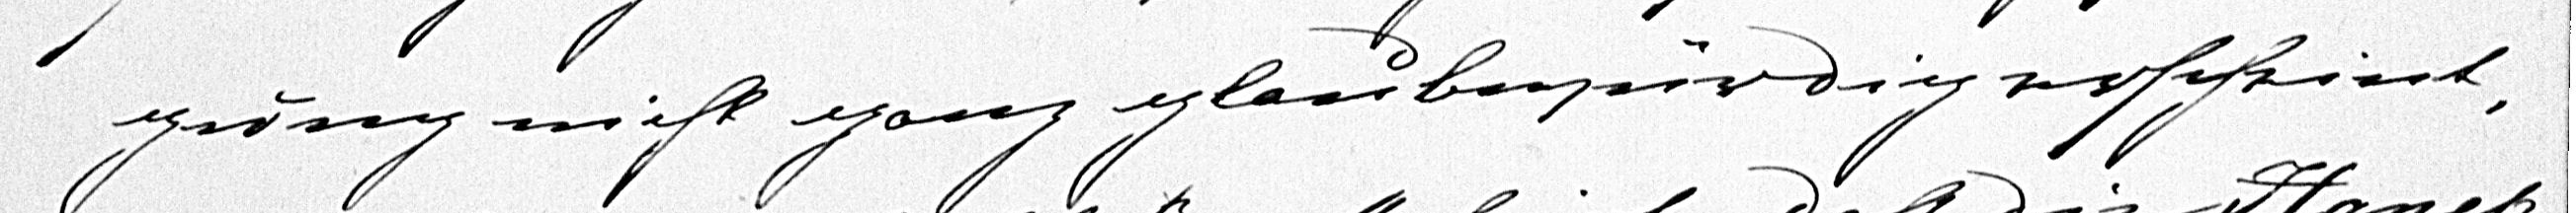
gung nicht ganz glaubwürdig erscheint,
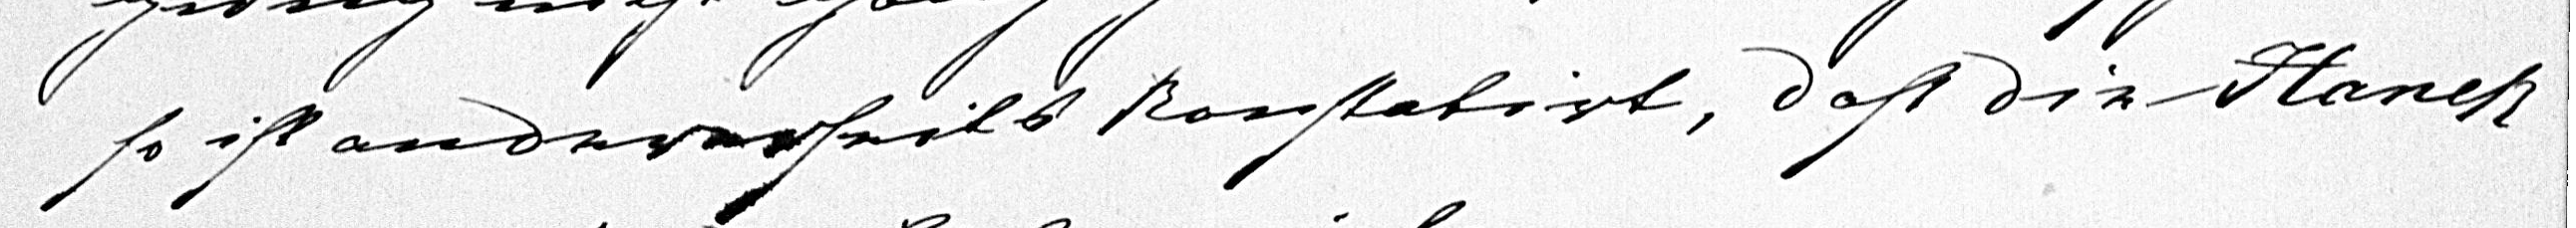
so ist andererseits konstatirt, daß die Hanek
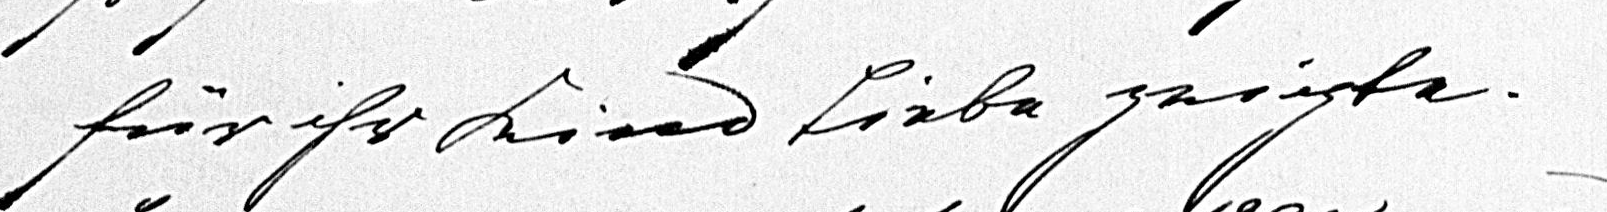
für ihr Kind Liebe zeigte.
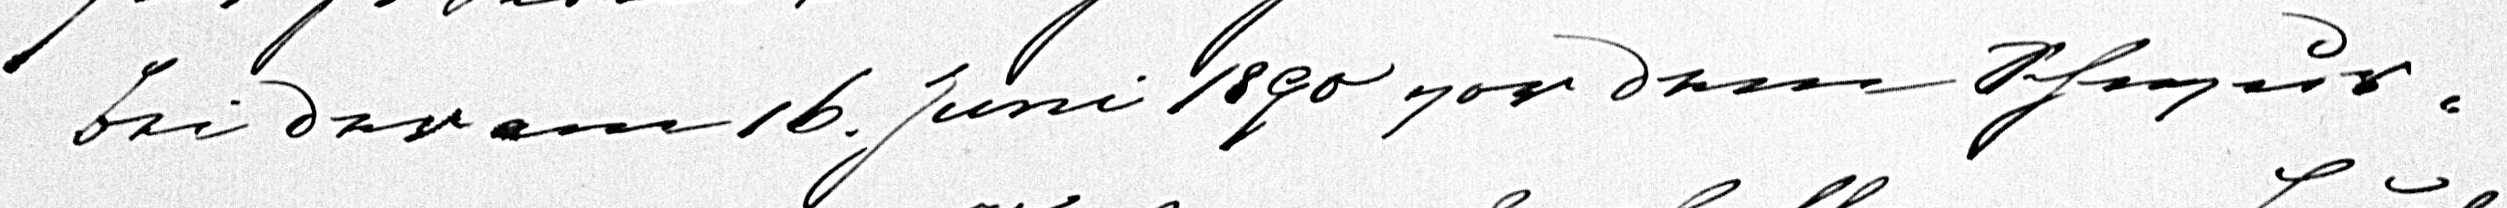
Bei der am 16. Juni 1890 vor dem Schwur¬
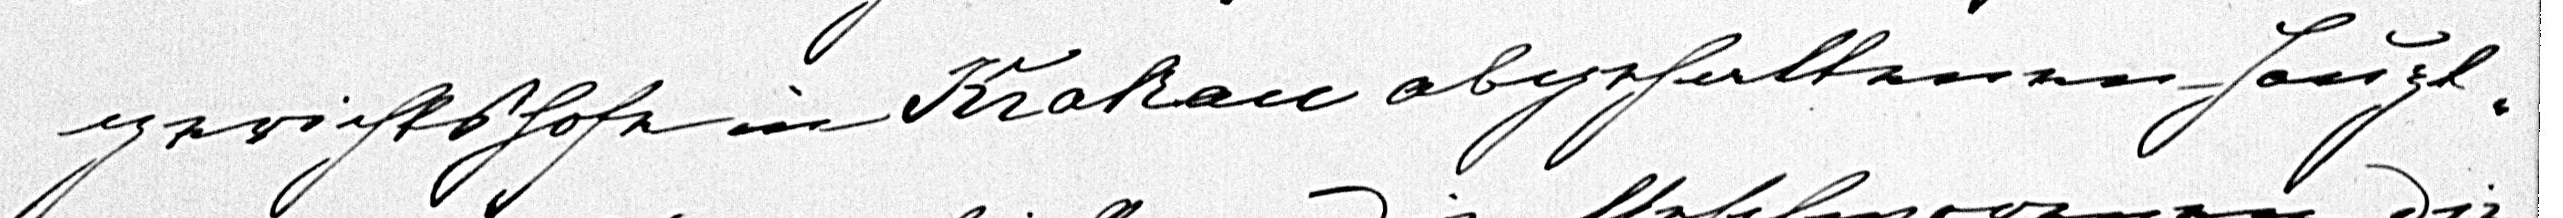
gerichtshofe in Krakau abgehaltenen Haupt¬
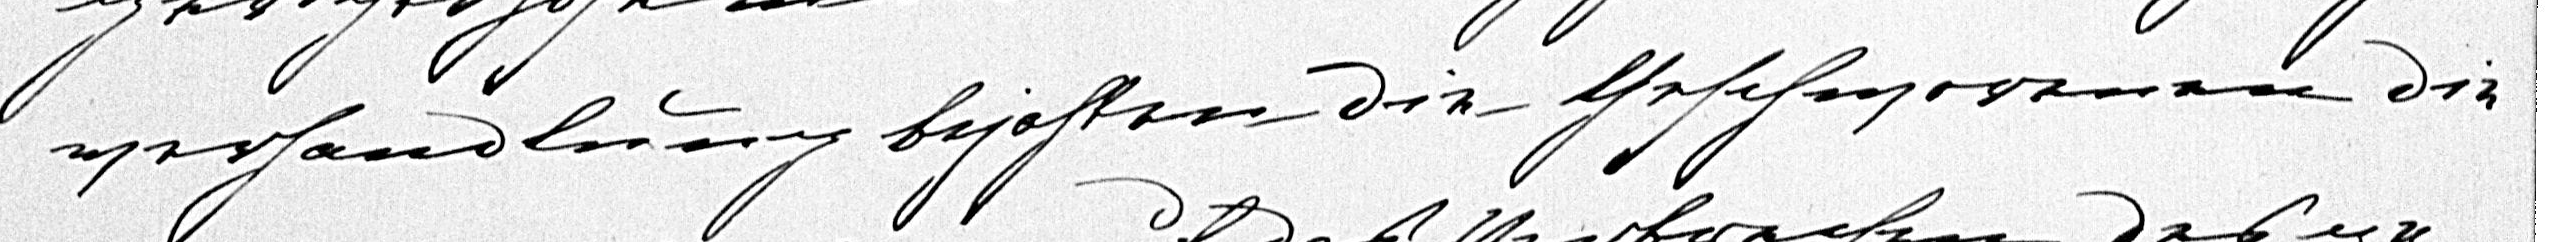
verhandlung bejahten die Geschworenen die
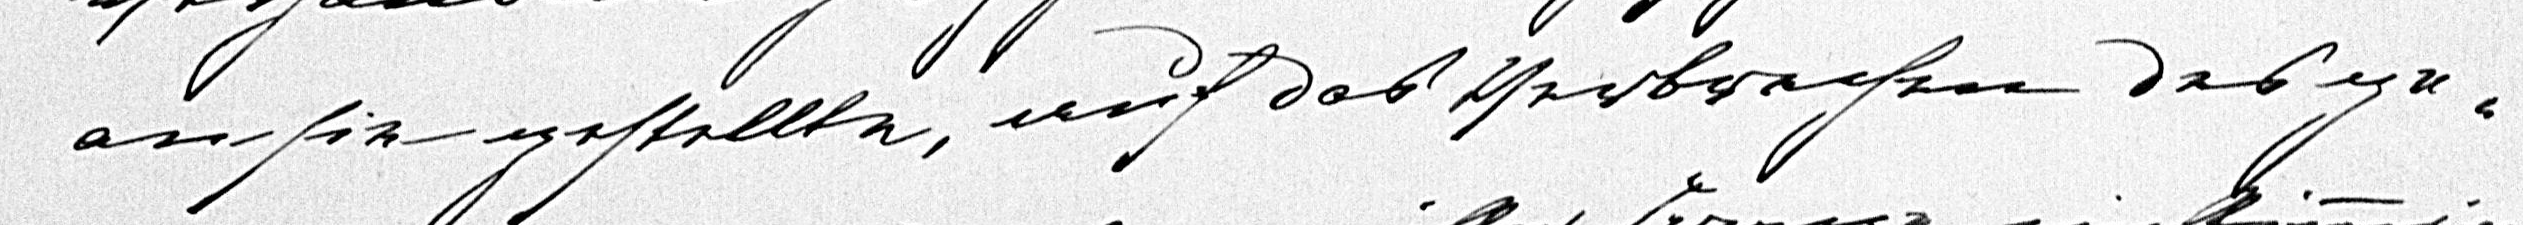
an sie gestellte, auf das Verbrechen des ge¬
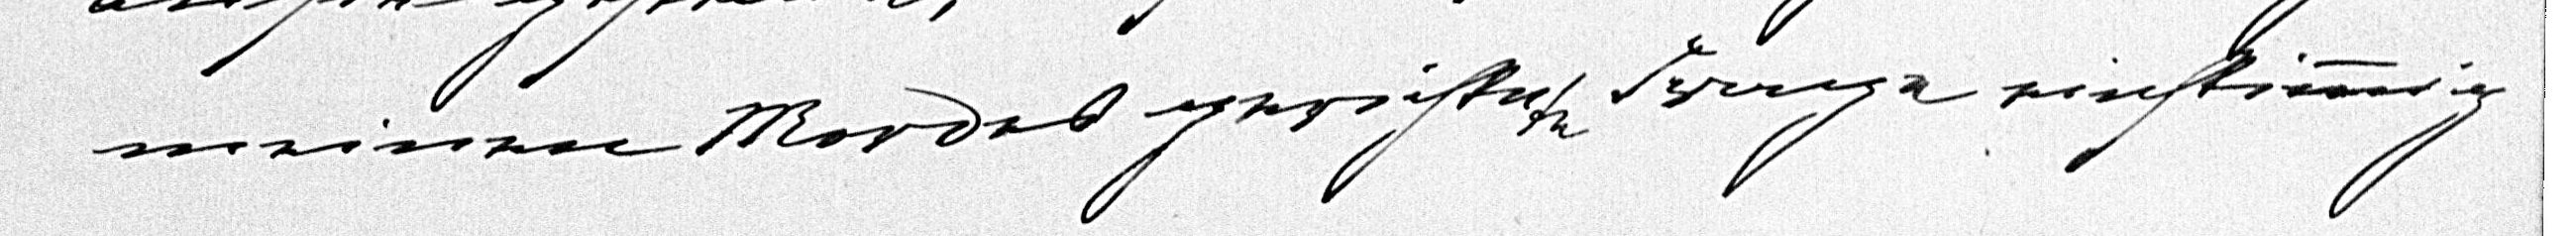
meinen Mordes gerichtete Trage einstimmig
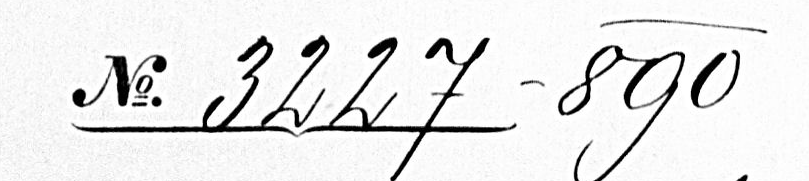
N° 3227-890
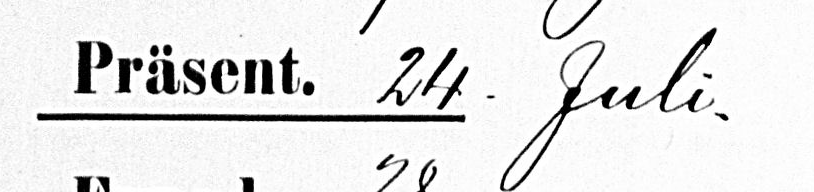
Präsent. 24. Juli.
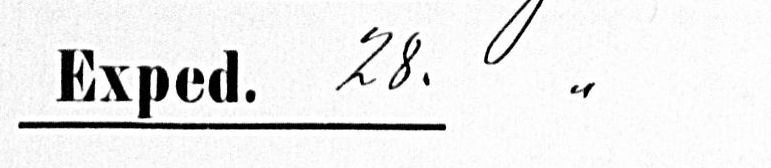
Exped. 28. Juli.
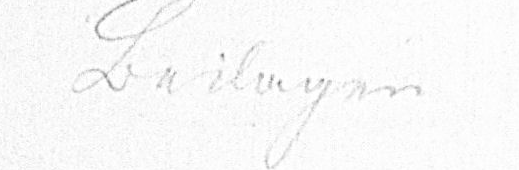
Beilagen
